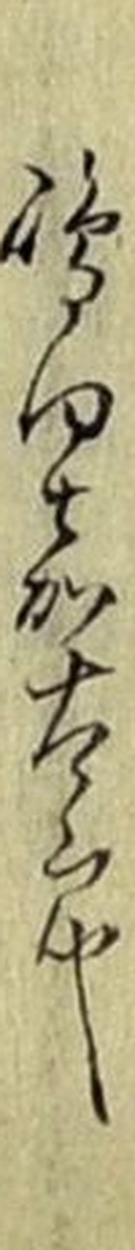嶋田嘉太郎
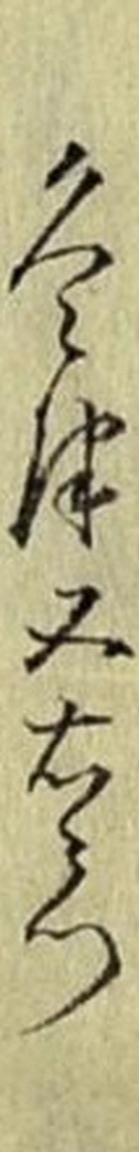久〃津又右衛門
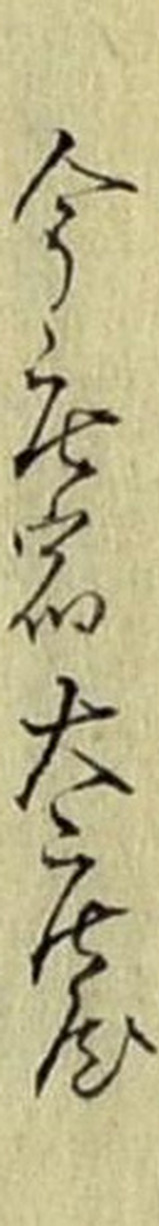今庄宿大庄屋
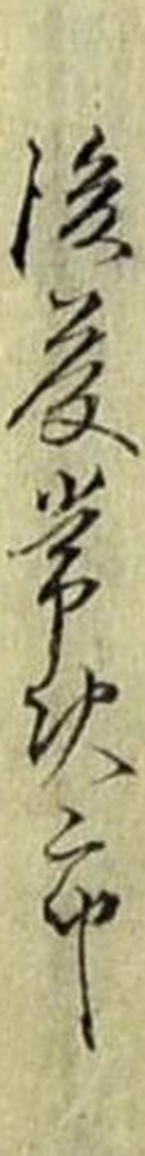後藤常次郎
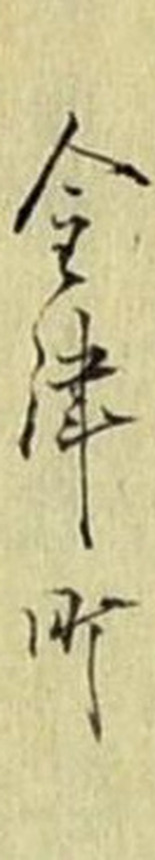金津町
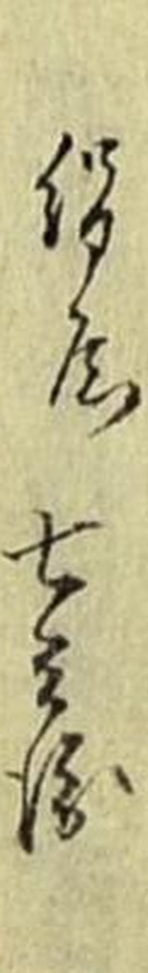絹屋七兵衛
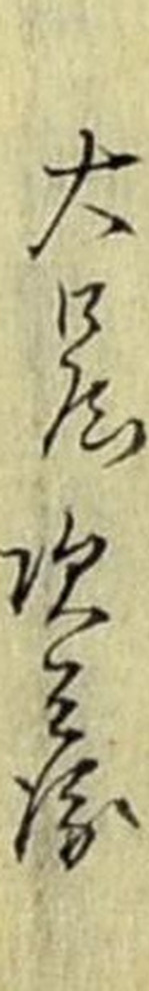大口屋次兵衛
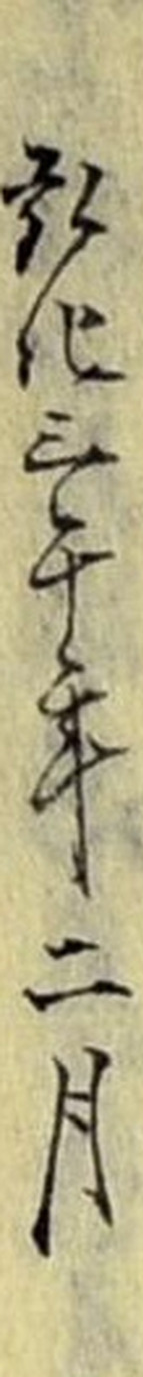弘化三午年二月
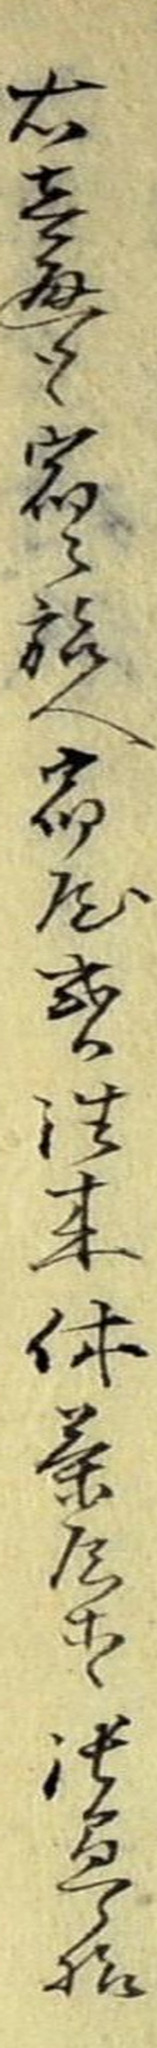右壱通つヽ宿々旅人宿屋或は往来休茶屋等へ張置候様

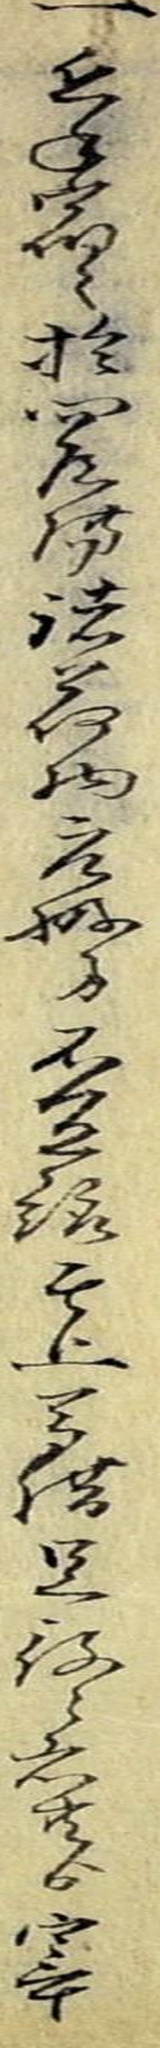一近年宿々於問屋場諸荷物取扱方不宜趣其上馬借足役之者共ゟ宰
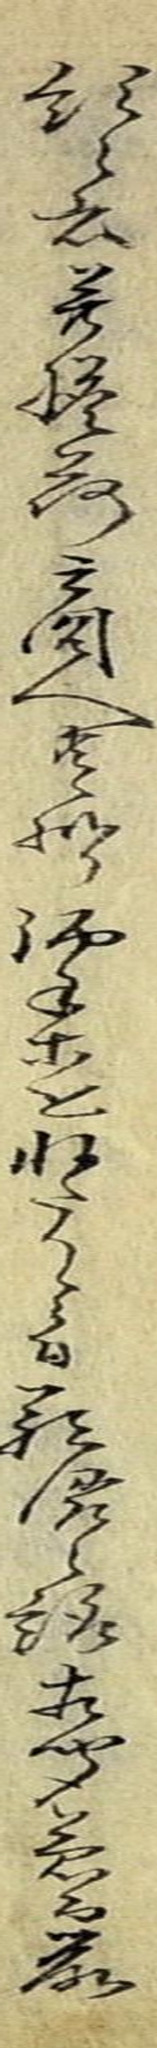領之者并担荷商人共へ掛り酒手等をねたり候に付難渋之趣相聞兼而厳
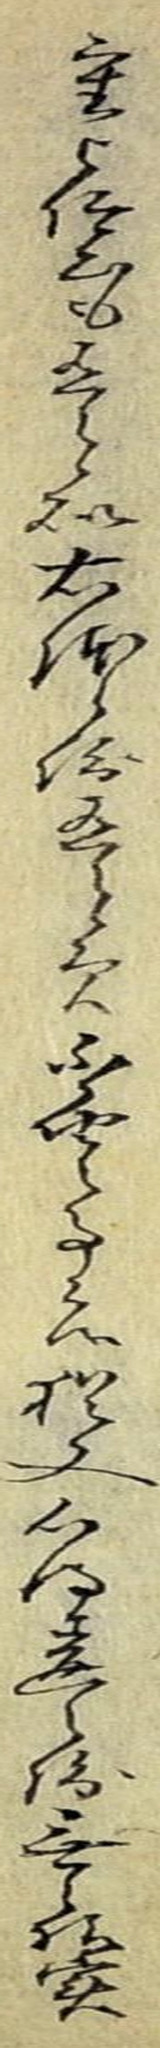重被仰出も有之候処右体之儀有之候而は不届之事に候猶又心得違之儀無之様実
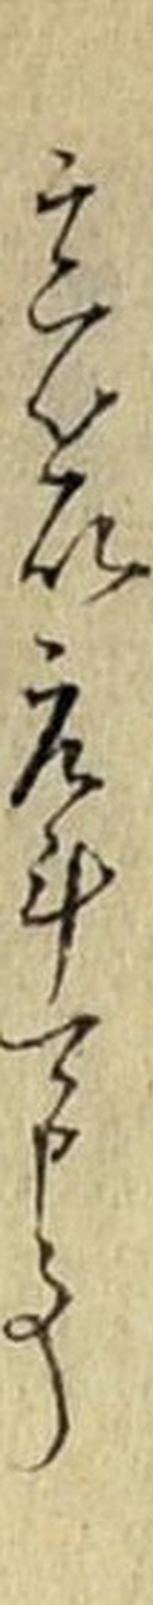意を以取斗可申事
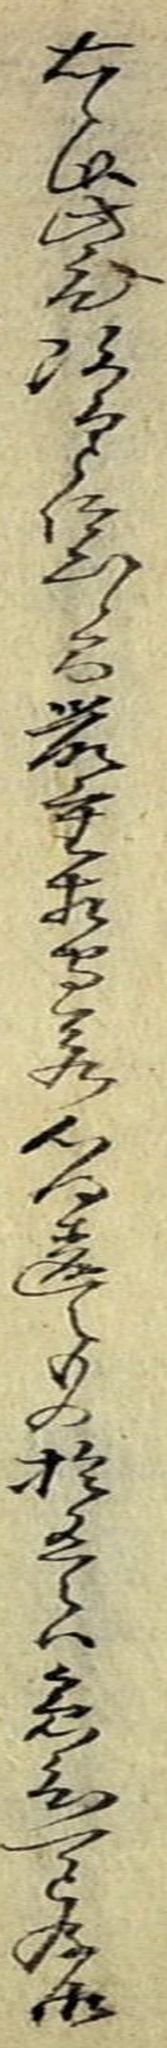右之趣此度改而被仰出候間厳重相守若心得違之もの於有之は急度可被及御
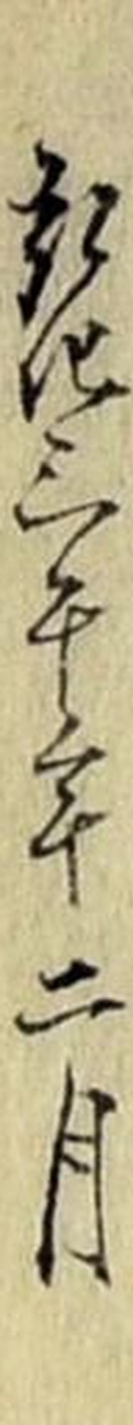弘化三午年二月
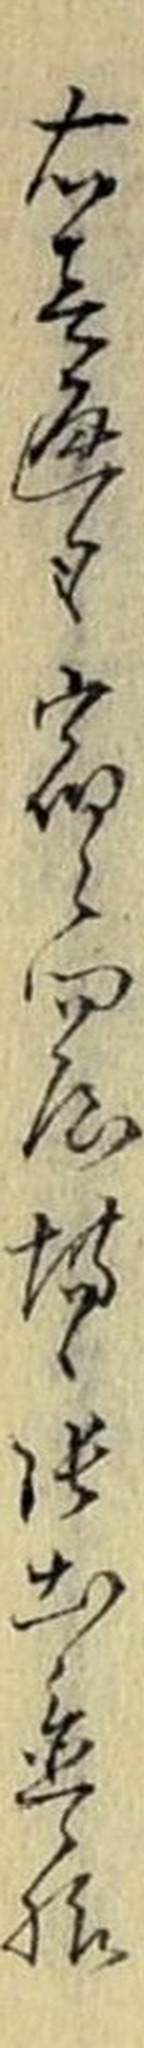右壱通つヽ宿々問屋場へ張出置候様
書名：命令之部 六
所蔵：福井県文書館 Fukui Prefectural Archives
